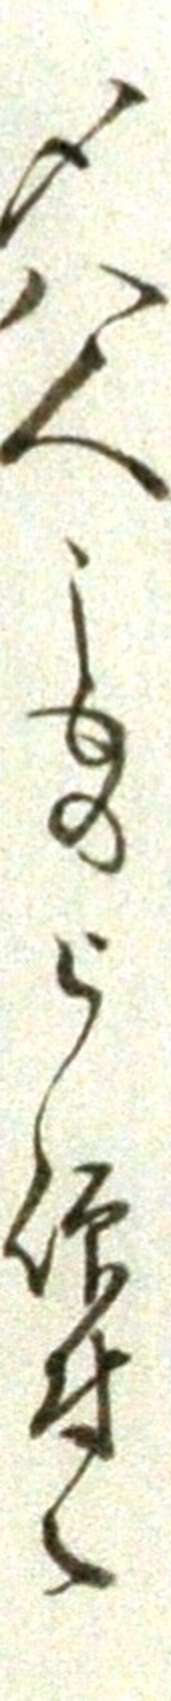〆八人之もの被仰付候
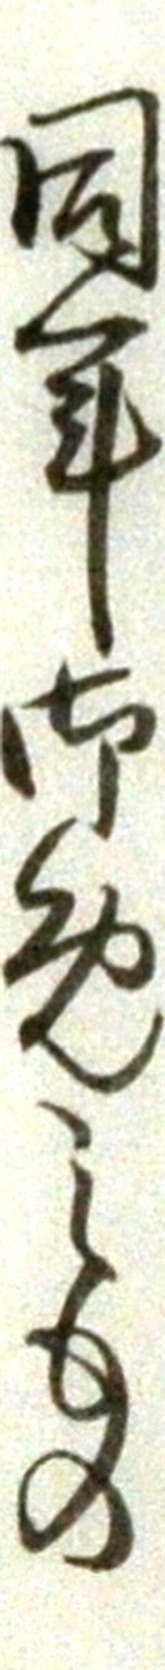同年御免之もの
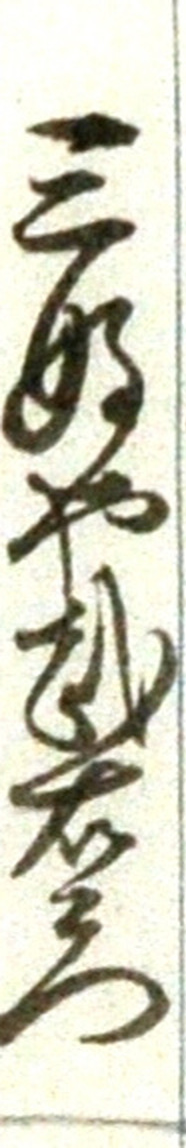三好や武右衛門
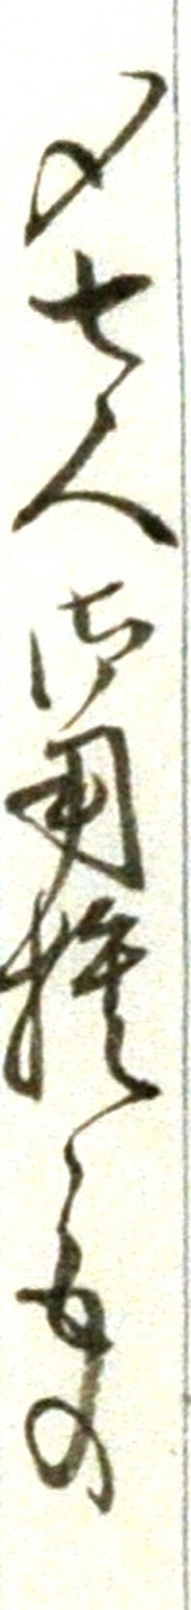〆七人御用捨もの
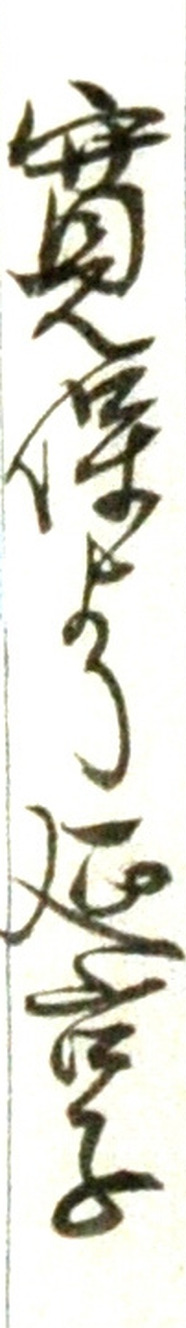寛保より延享

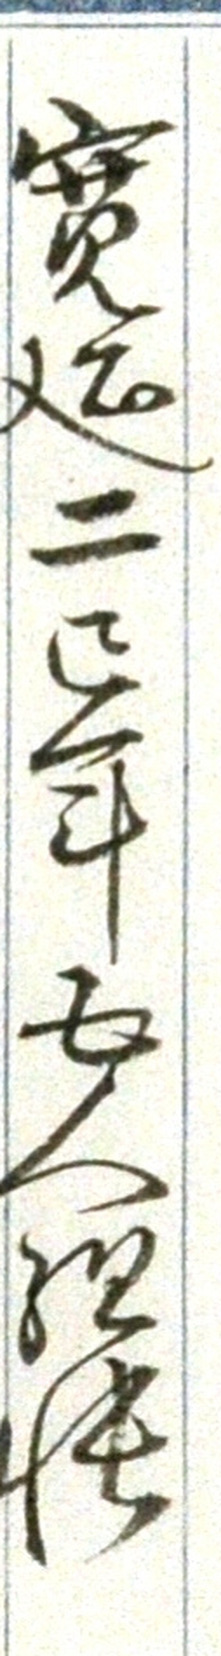寛延二巳年五人組帳
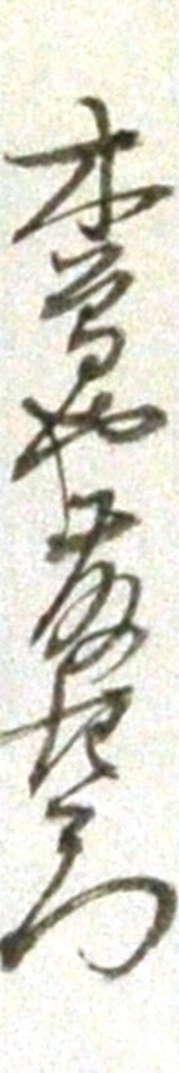木曽や藤左衛門
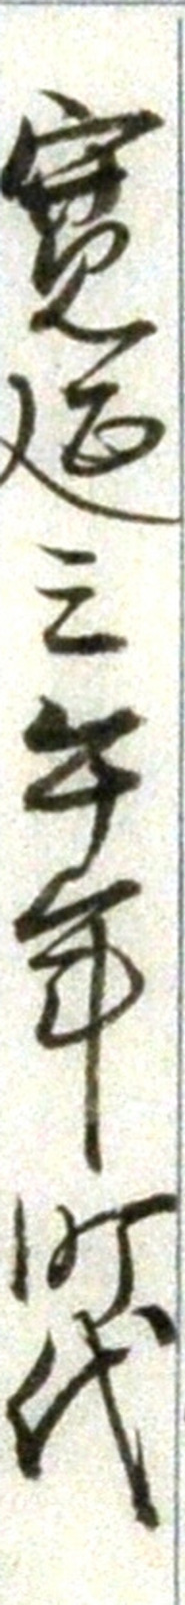寛延三午年町代
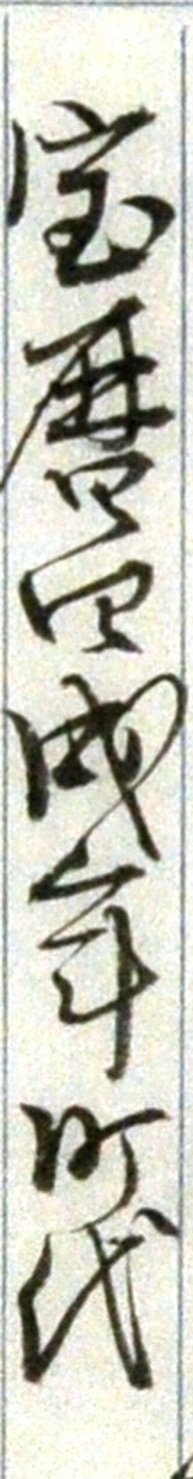宝暦四戌年町代
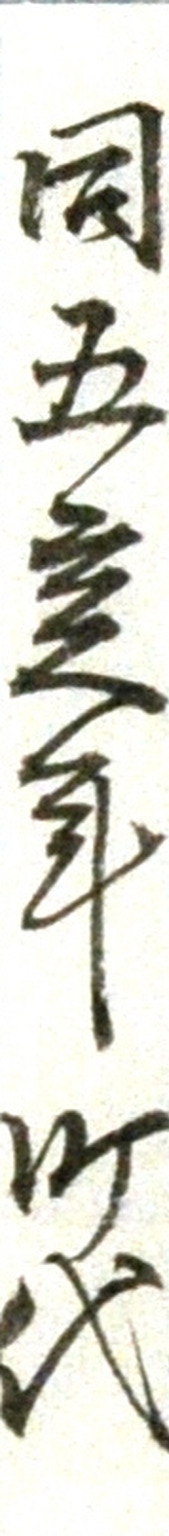同五亥年町代

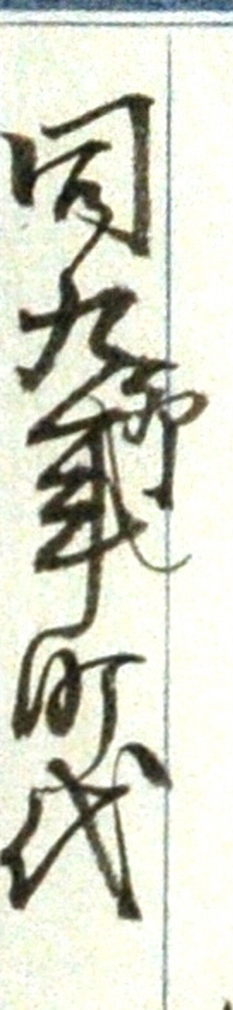同九卯年町代
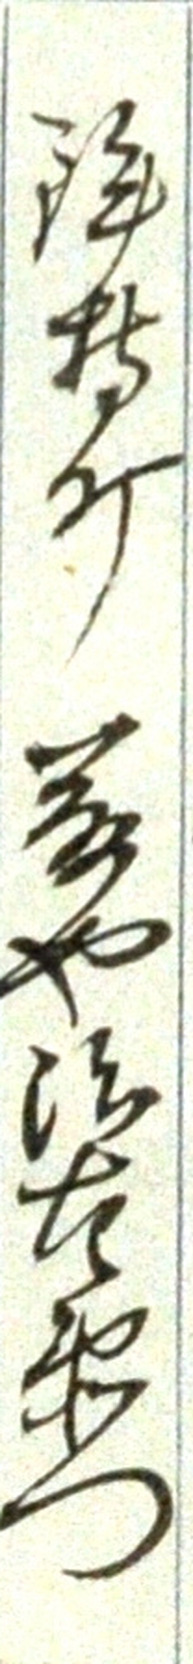鉾持町藤や治左衛門
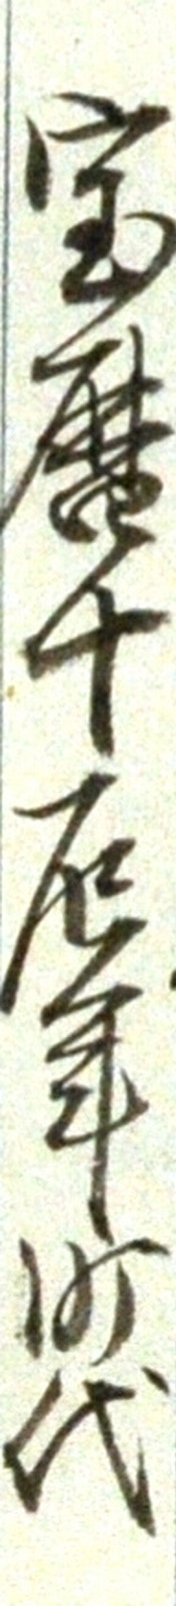宝暦十辰年町代
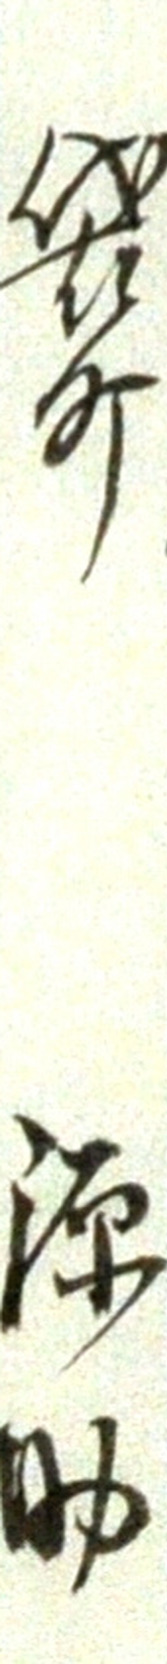袋町源助
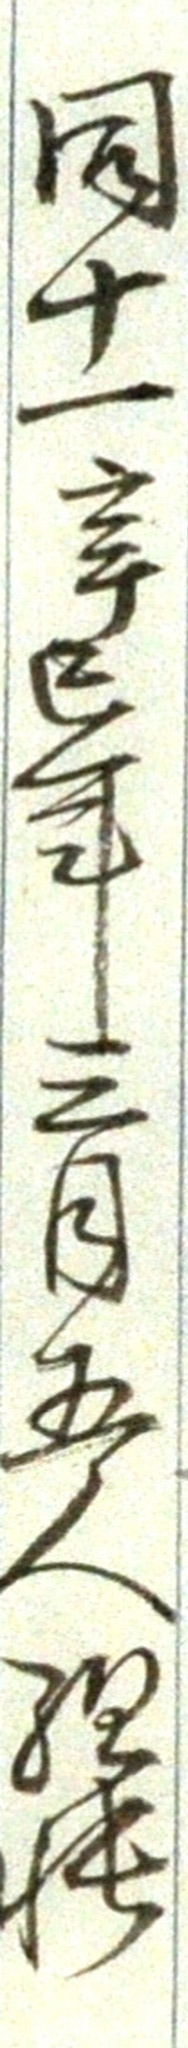同十一辛巳年三月五人組帳
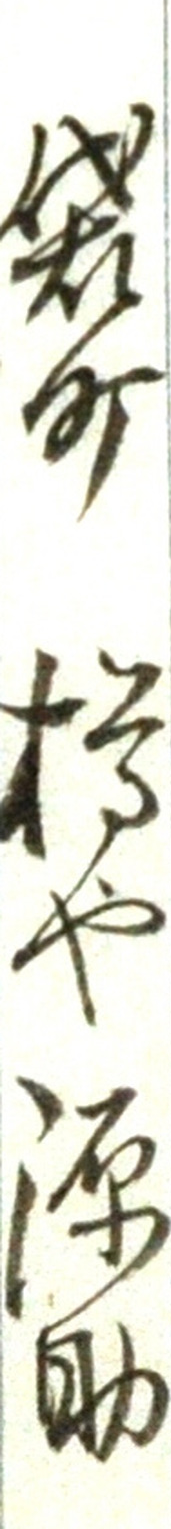袋町樽や源助
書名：町方町代名前書
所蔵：伊那市立高遠町図書館・合同会社AMANE
